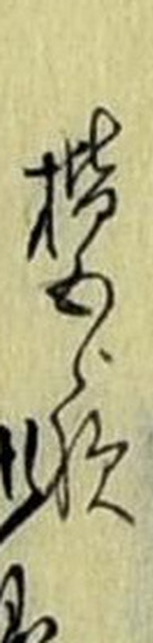楷五郎様
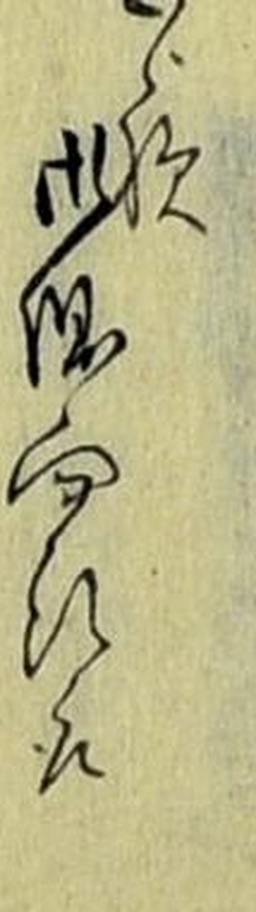御側向頭取
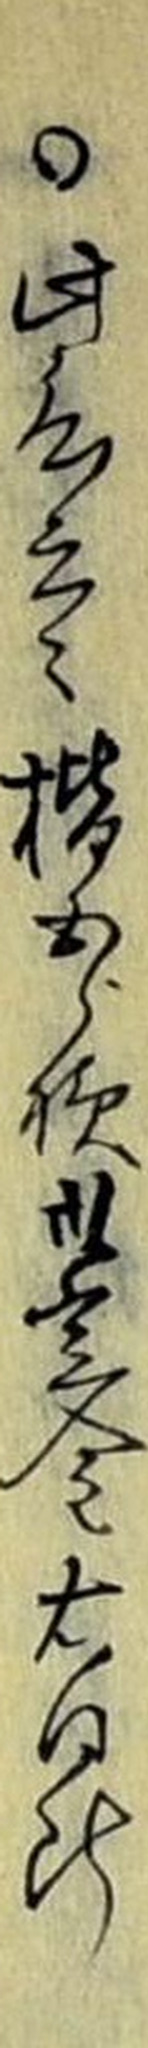○此度云々楷五郎様御定金右同断
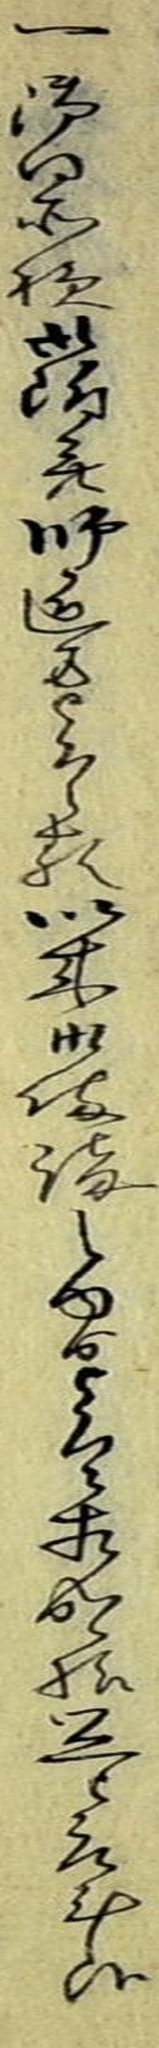一御同所様御附并師匠方被下候類以來御備講之内ゟ被下に相成候様宜被取斗候
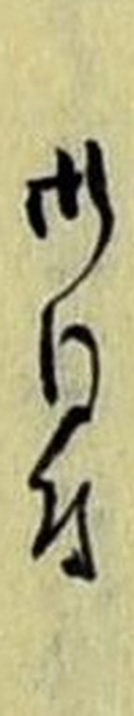御目付
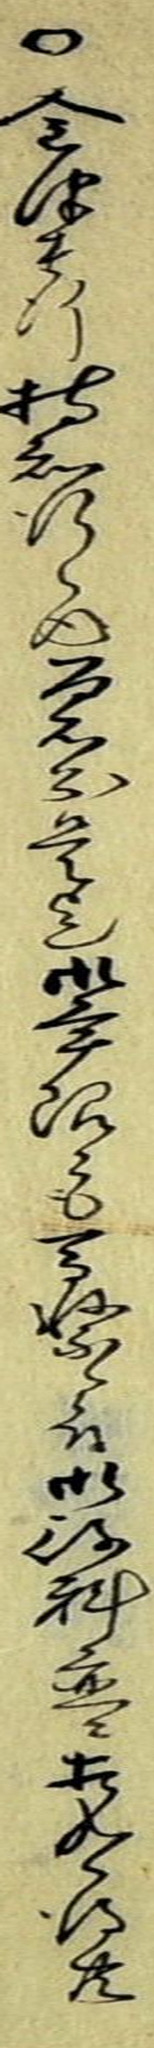○金津奉行知行所之内百石分是迄御年限にも馬繋候に付御役料並に相成候得共
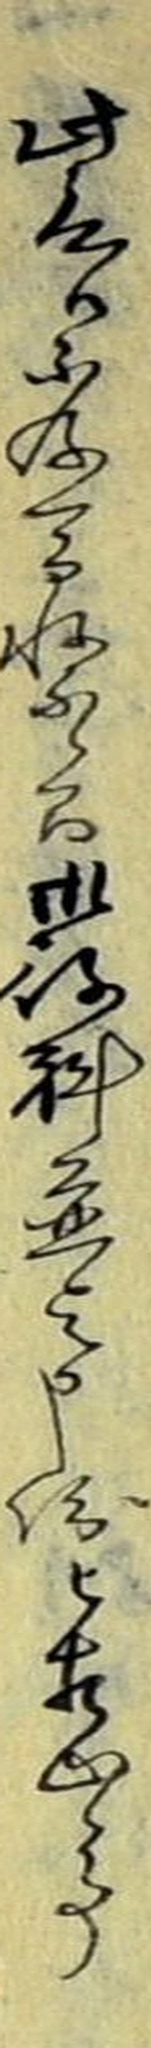此度は不及馬繋候間御役料並と申儀被相止候事

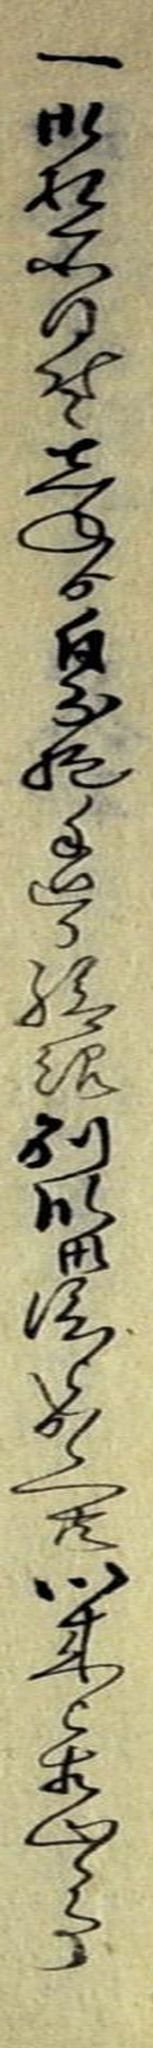一御札所目付へ先年ゟ自分抱手廻り給銀別段御渡被成候へ共以來被止候事
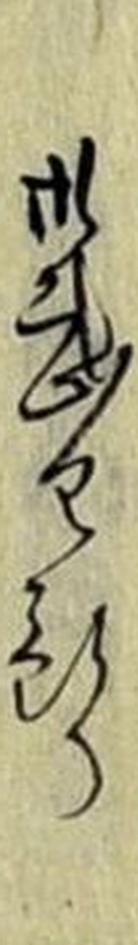御武具預り
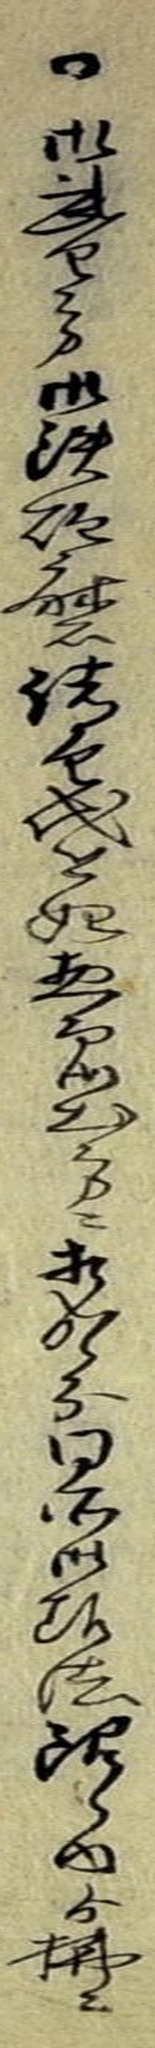○御武具方御鉄砲磨諸具代を始惣而御出方に相成候分同所御趣法限之内ゟ払に
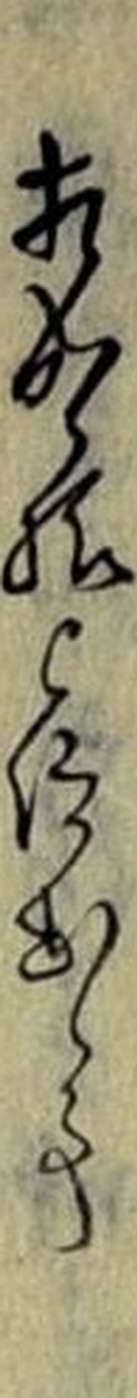相成候様被仰出候事
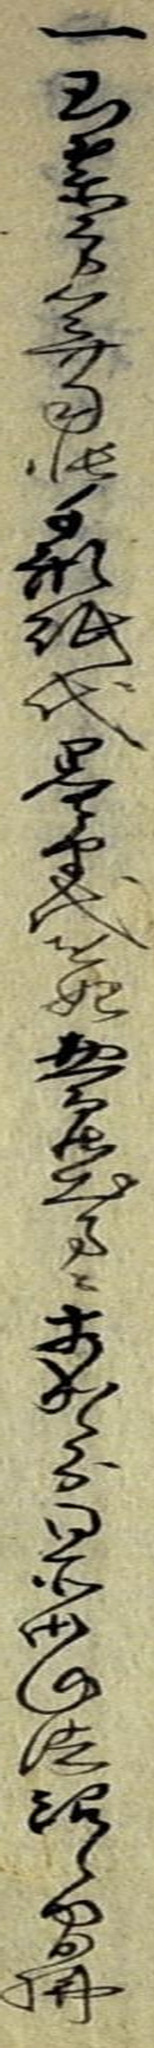一玉薬方算用帳手形紙代墨筆代を始惣而仕出方に相成候分同所御趣法限之内ゟ払
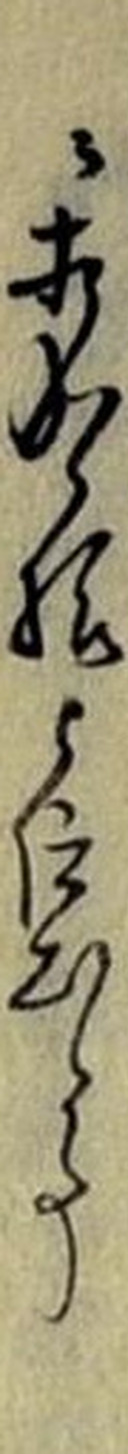相成候様被仰出候事
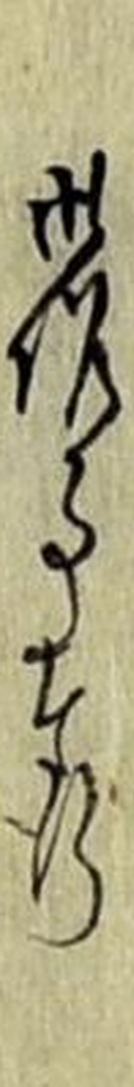御作事奉行
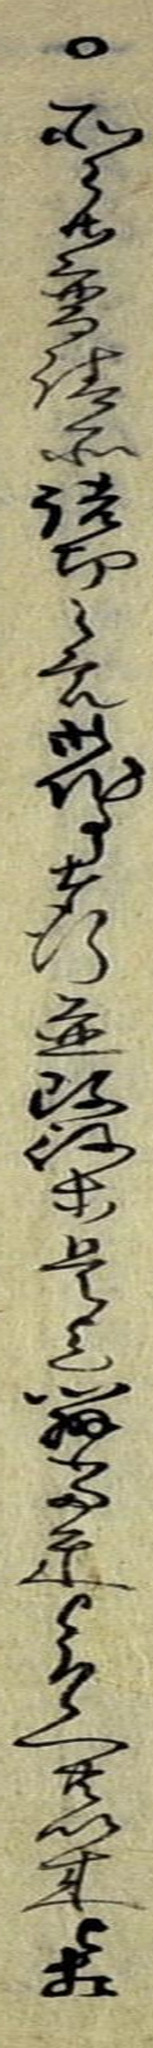○所々共普請所詰切之節御作事奉行並改役等是迄弁当米被下候へ共以來被相
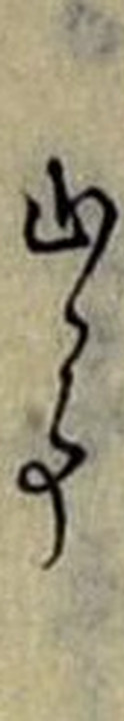止候事
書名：命令之部 六
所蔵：福井県文書館 Fukui Prefectural Archives
